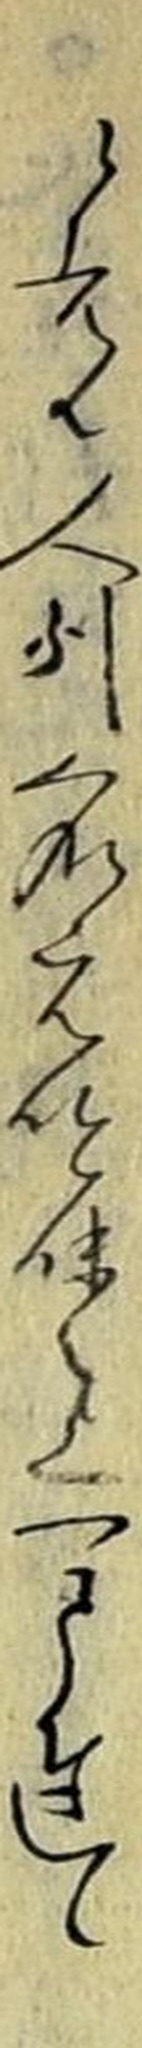之者共人別名元吟味之上可申達候
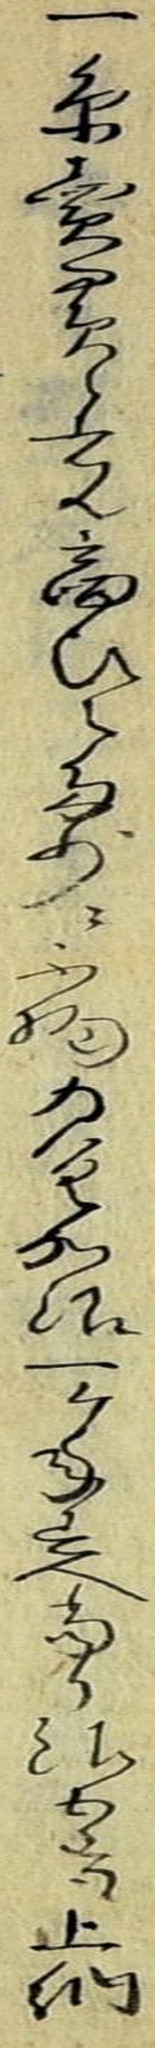一糸売買之者共商ひ之多少に不拘為冥加銀一ヶ年壱人当り銀五匁つヽ上納
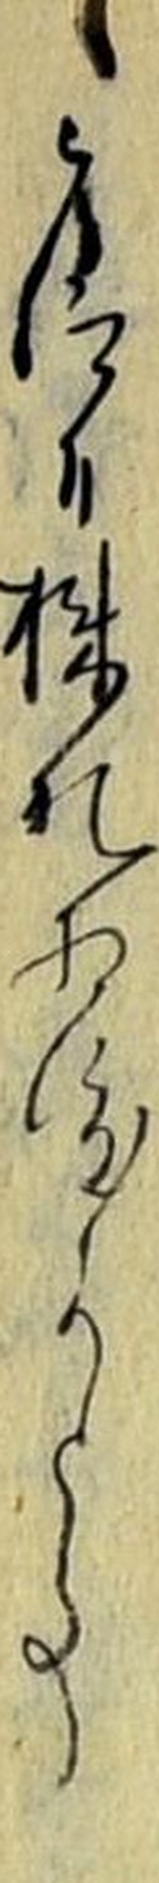被仰付株札相渡可申事
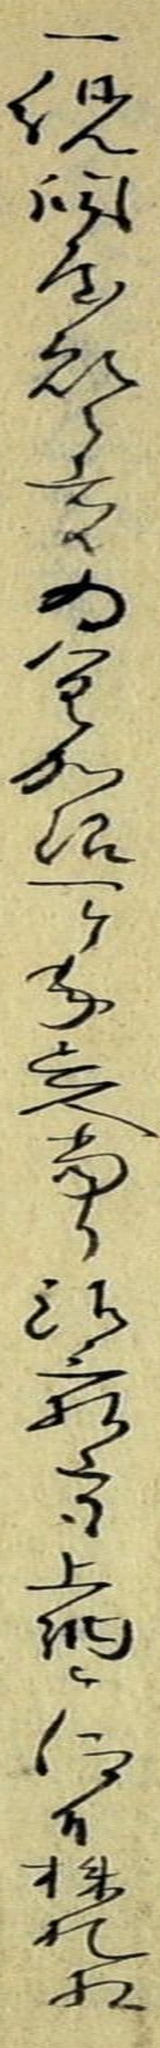一繭問屋願之者共為冥加銀一ヶ年壱人当り銀三拾匁つヽ上納被仰付株札相
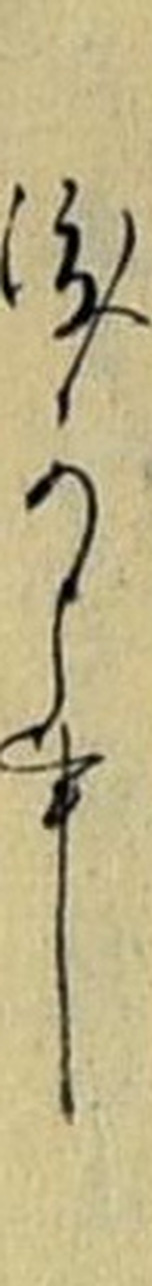渡可申事
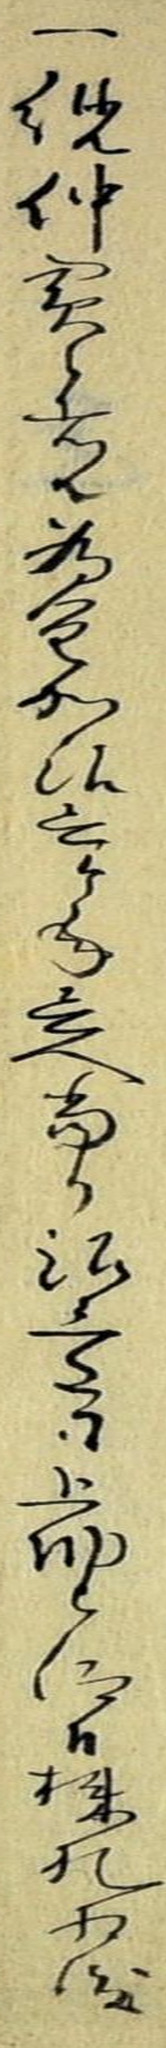一繭仲買之者共為為冥加銀壱ヶ年壱人当り銀三匁つヽ上納被仰付株札相渡
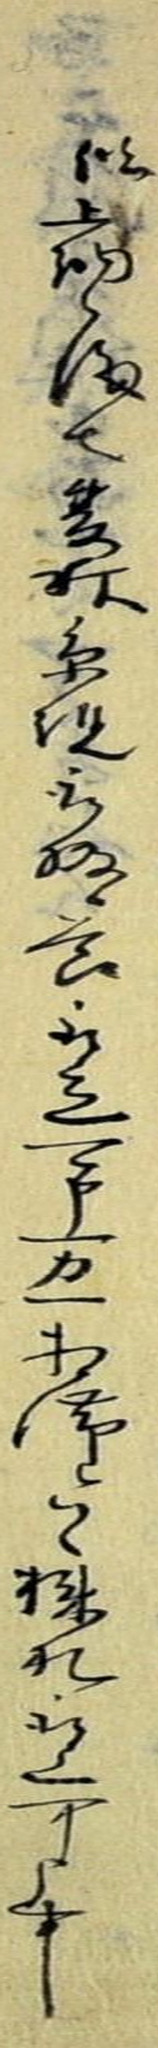但上納之儀は夏秋糸繭取扱候節取立可申万一相滞候はヽ株札取上可申事
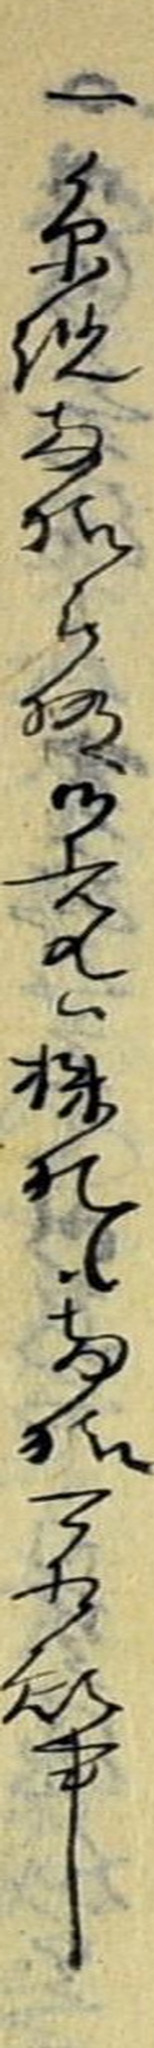一糸繭両様取扱候者共は株札も両様可相願事
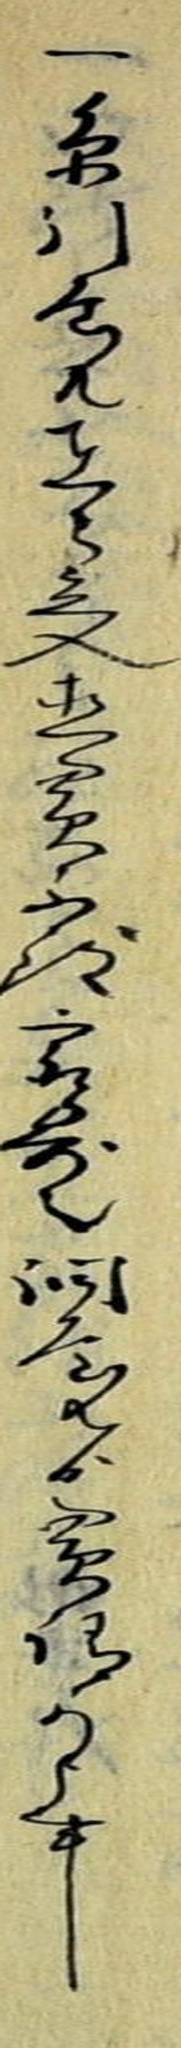一糸引合共在々立入直買不致最寄之問屋共ゟ買請可申事
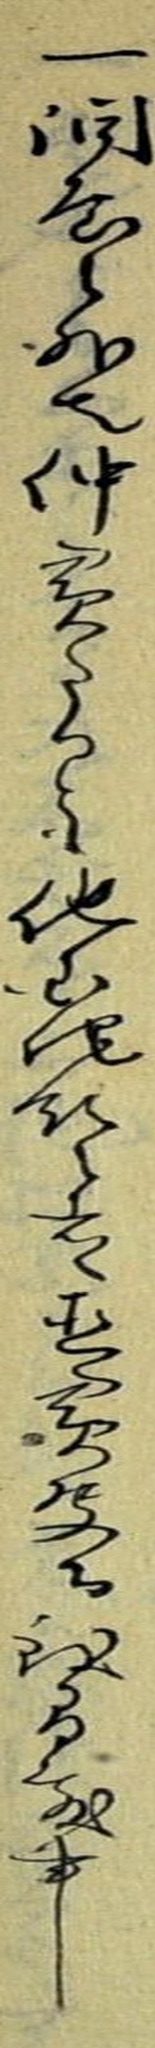一問屋之外は仲買たりとも他国他領之者へ直買決而致間敷事
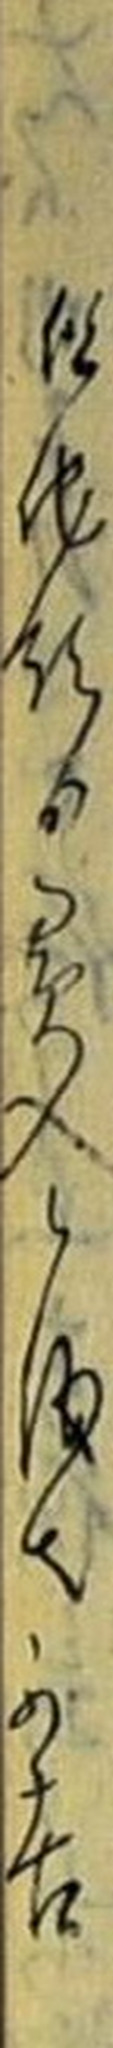但他領ゟ買入候儀は不苦
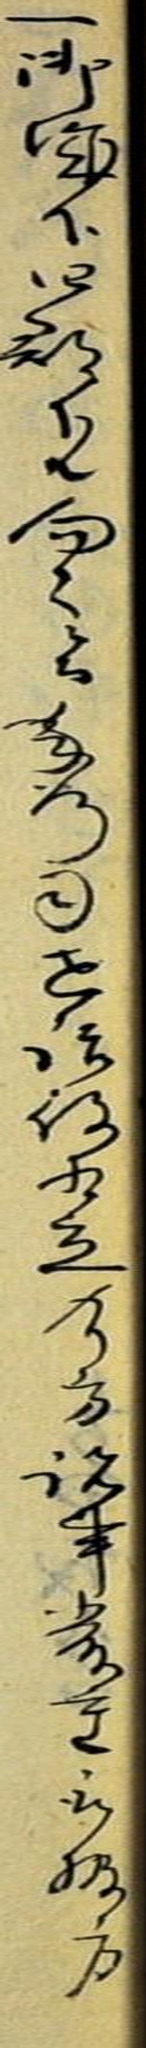一御城下四郡下共向々に而年行司世話役相立〆り方諸事厳重取扱方
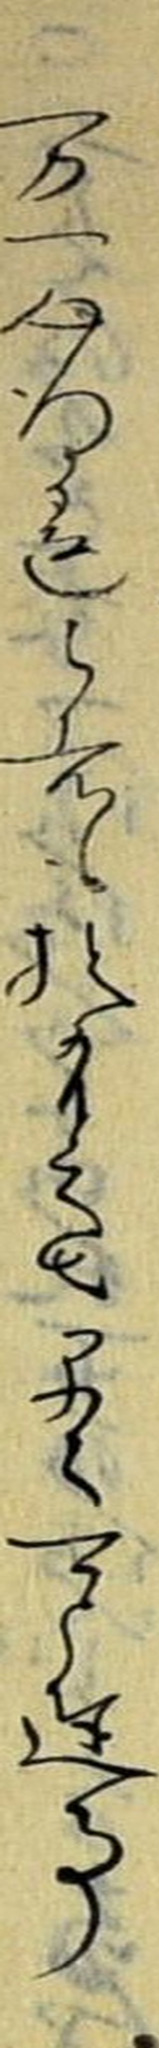万一心得違之者も於有之は早々可申達事
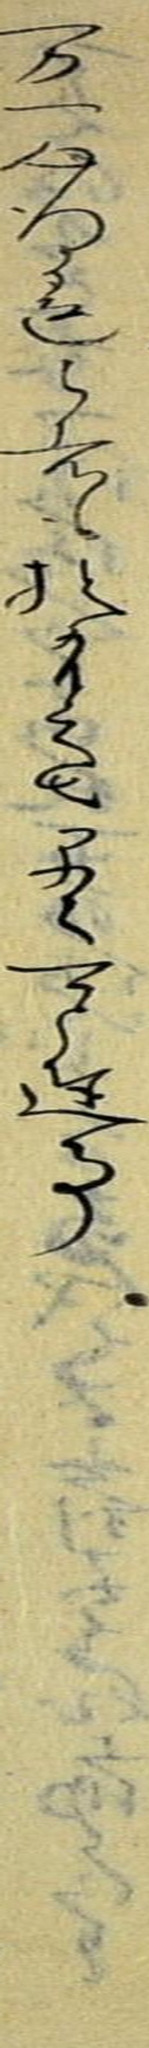万一心得違之者も於有之は早々可申達事
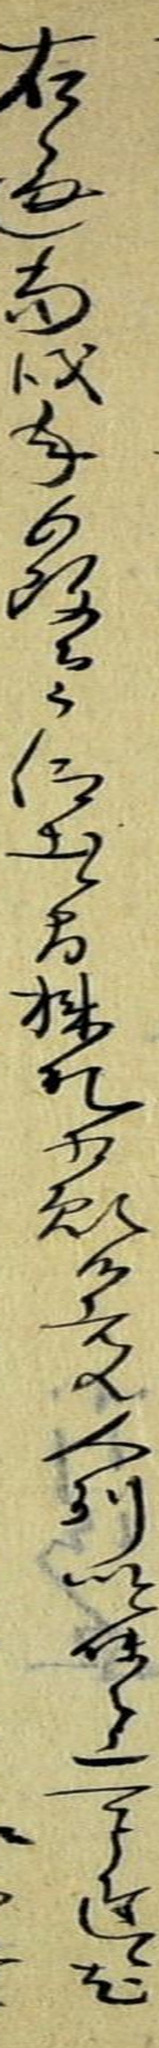右之通当戌年ゟ改而被仰出候間株札相願候者共人別吟味之上可申達候尤
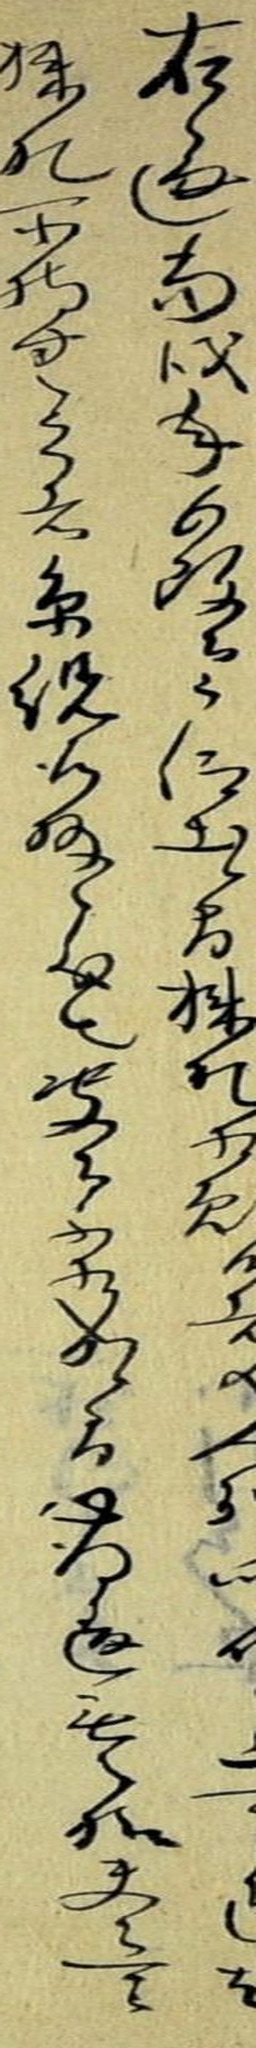株札所持無之者糸繭取扱候儀は決而不相成候に付心得違無之様夫々可被
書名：命令之部 四
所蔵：福井県文書館 Fukui Prefectural Archives
